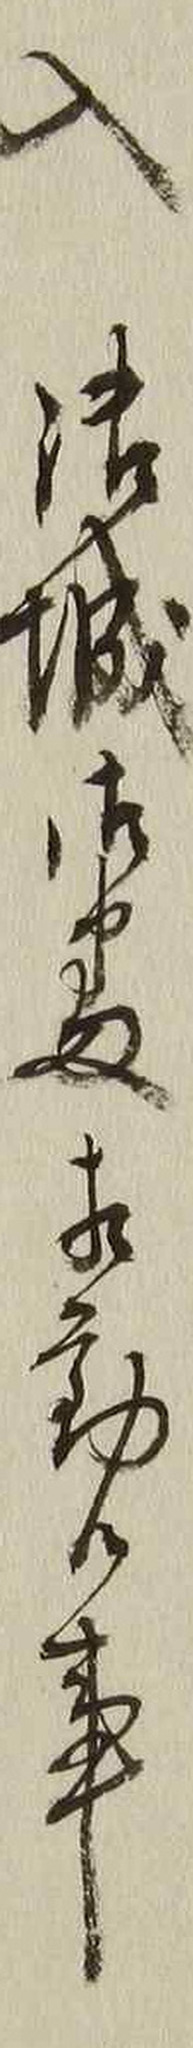入御城御番相勤候事
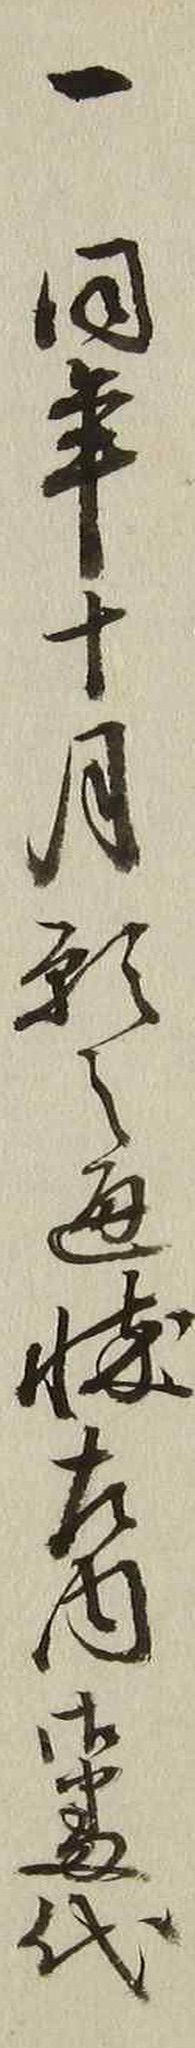一同年十月願之通悴左内御番代
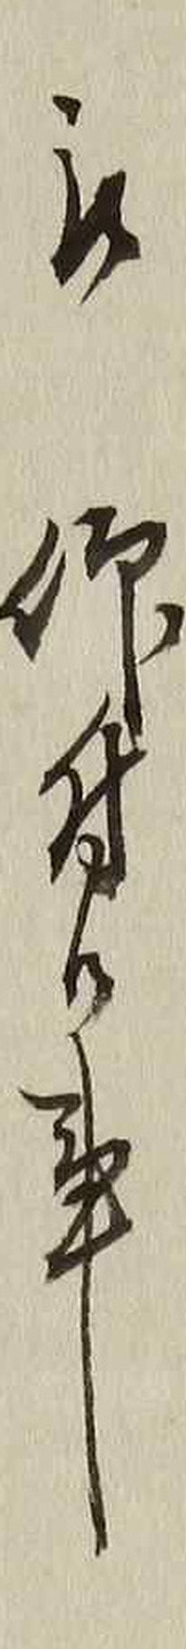被仰付候事
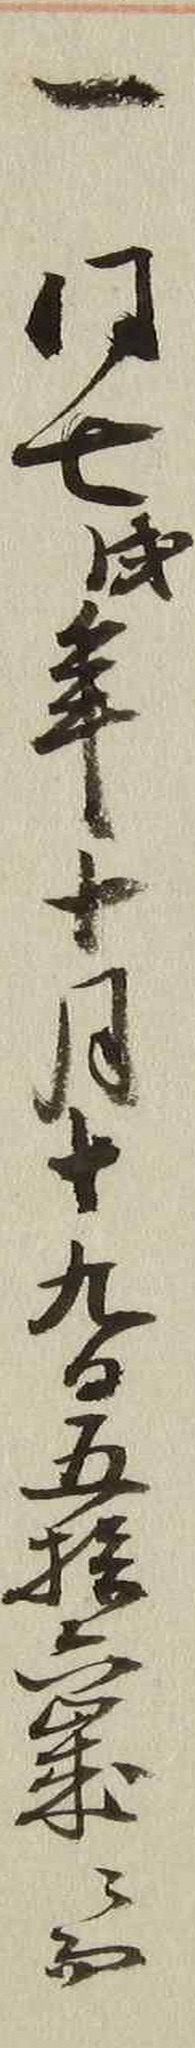一同七戌年十月十九日五拾六歳ニ而
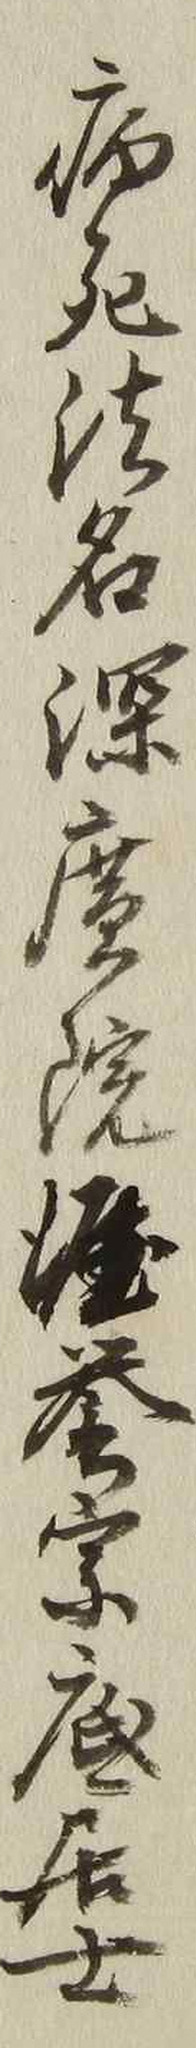病死法名深広院誉宗底居士
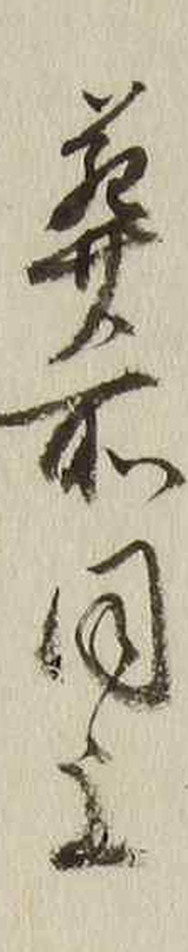葬所同上
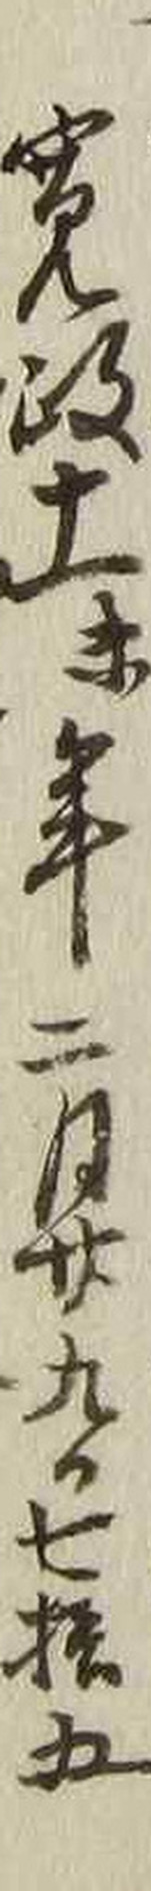寛政十一未年二月廿九日七拾五
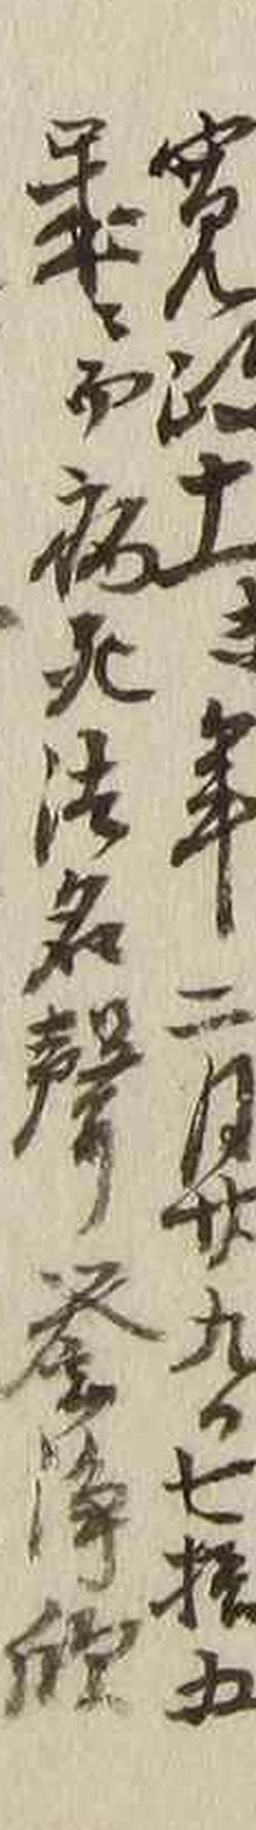歳ニ而病死法名声誉浄欣
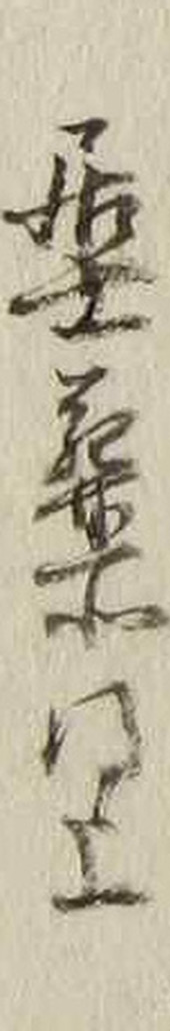居士葬所同上
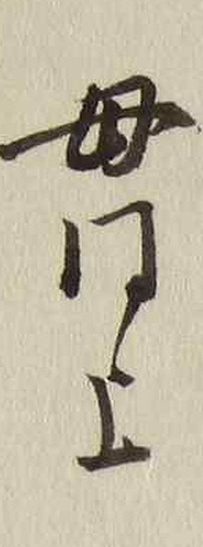母同上

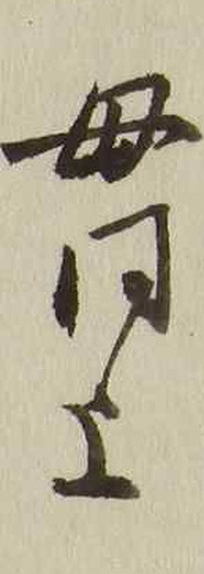母同上
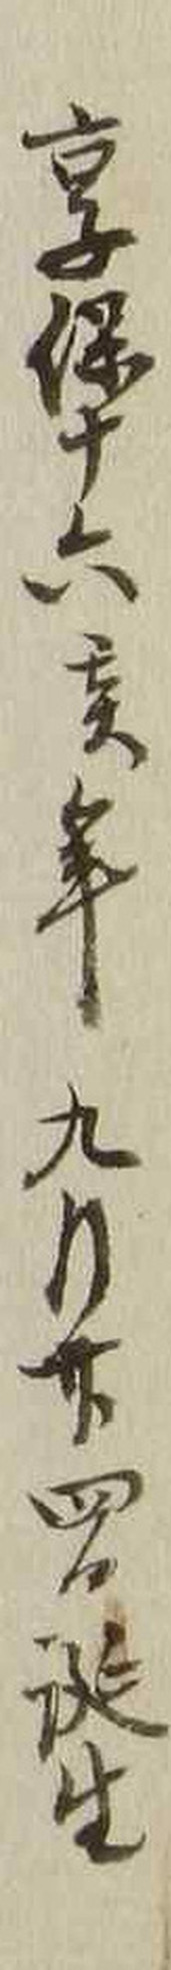享保十六亥年九月廿四日誕生
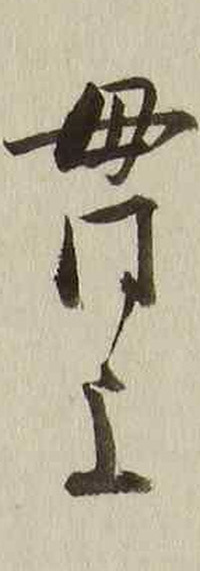母同上
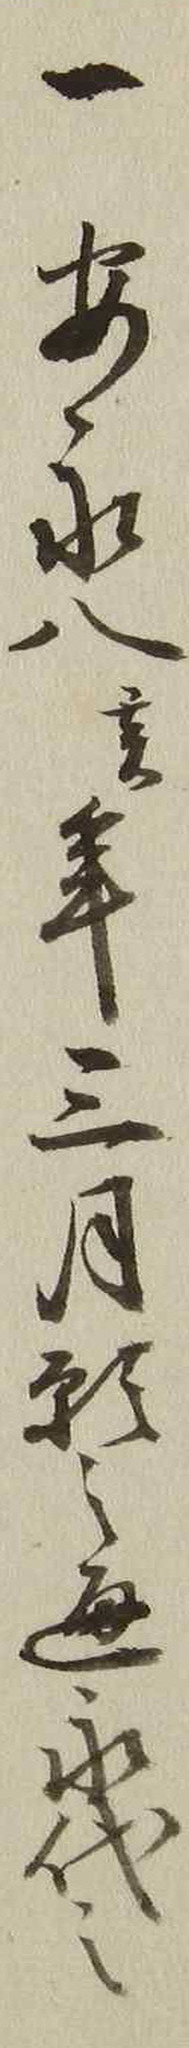一安永八亥年三月願之通永代之
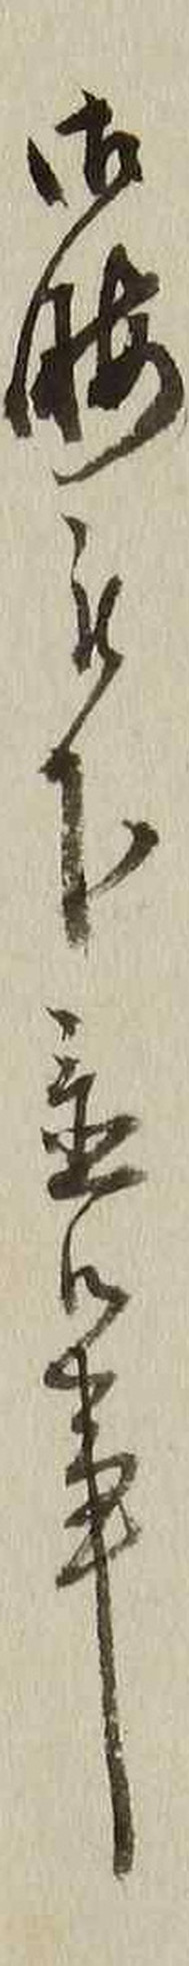御暇被下置候事
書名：諸士系譜　巻之23　い之部23
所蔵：会津若松市立会津図書館
